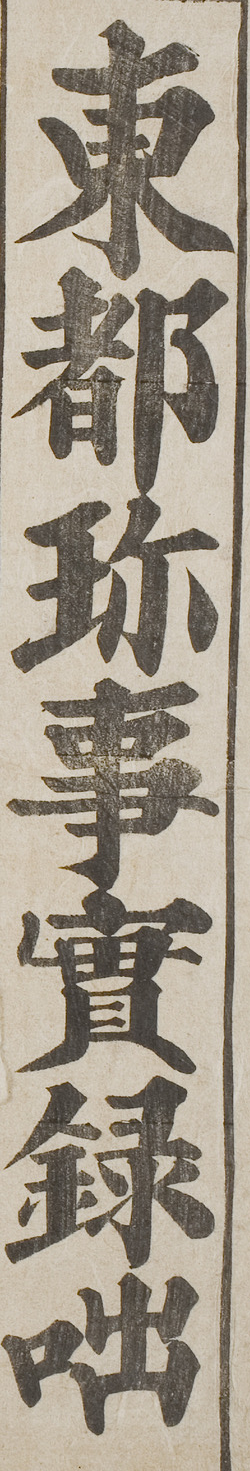東都珎事実録咄
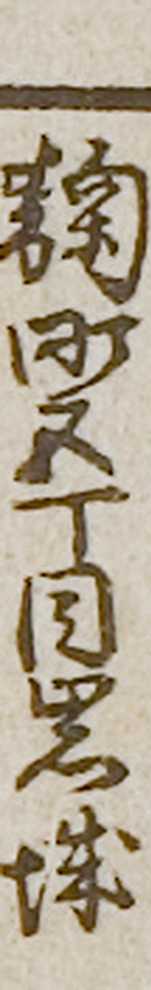麹町五丁目岩城
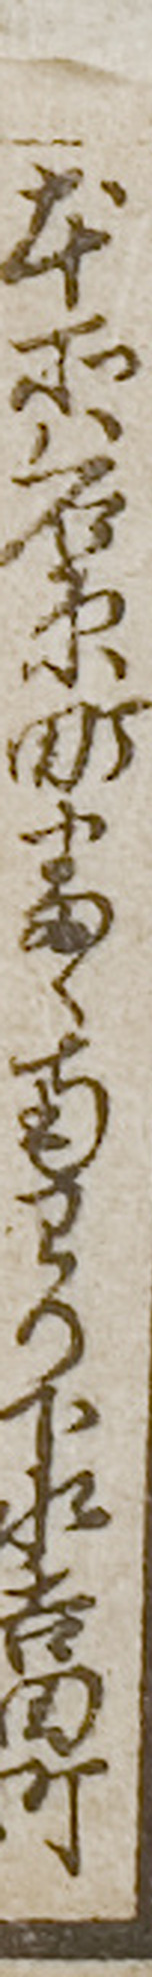本所は石原町番く南わり下水吉田町
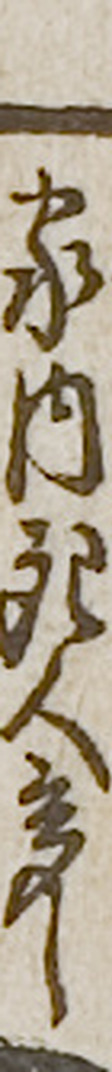家内死人多し
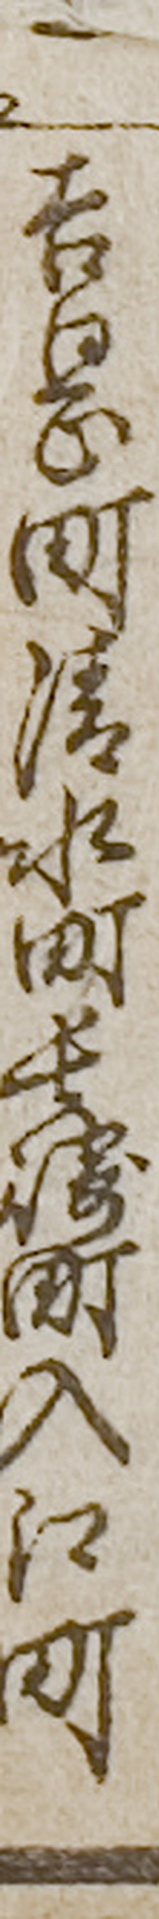吉岡町清水町長崎町入江町
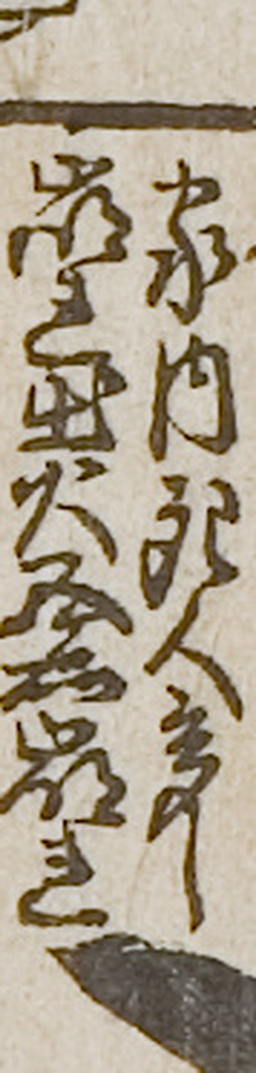崩れ出火五ヶ所崩れ
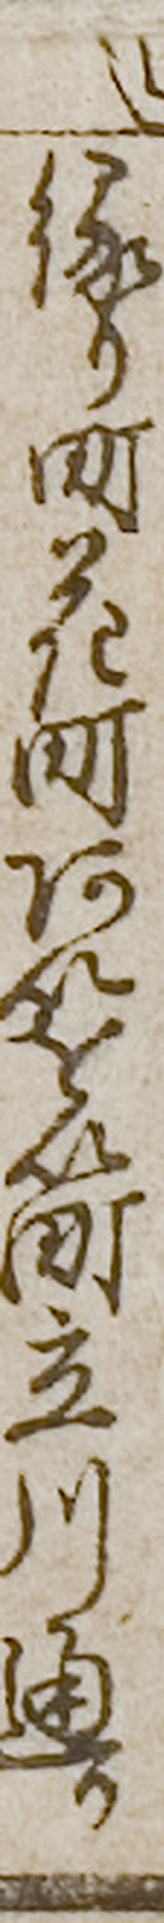縁り町花町あいをい町立川通り
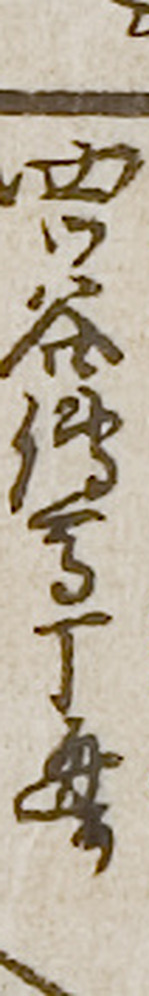四ッ谷伝馬丁通り
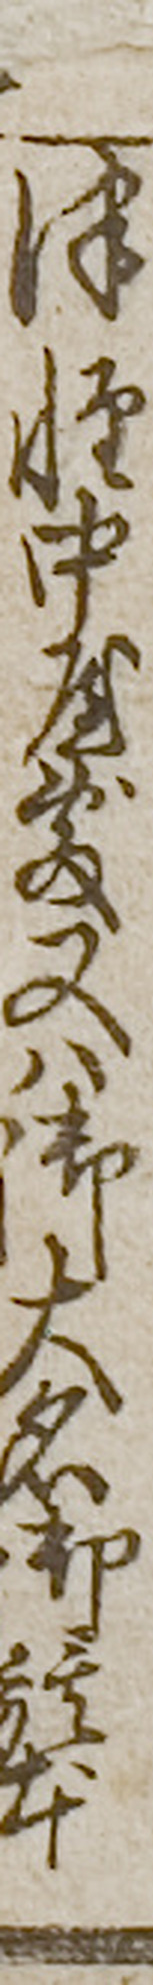津軽中屋敷又は御大名御旗本
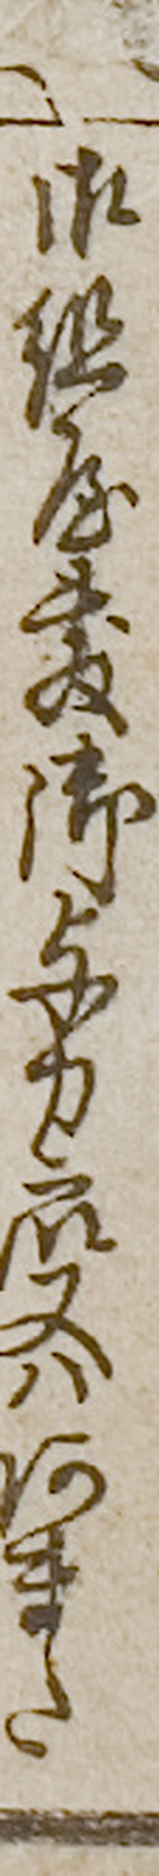御組屋敷御与力衆又はあまた
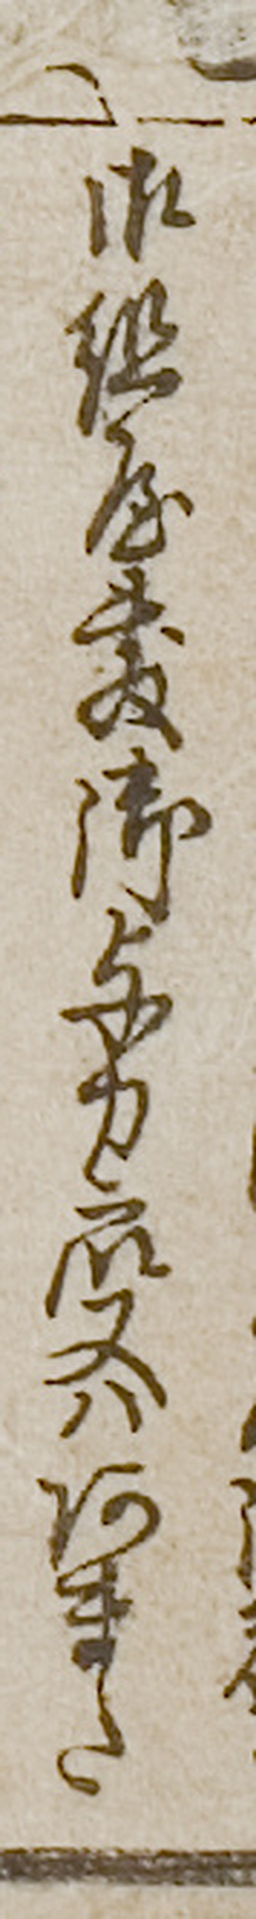御組屋敷御与力衆又はあまた
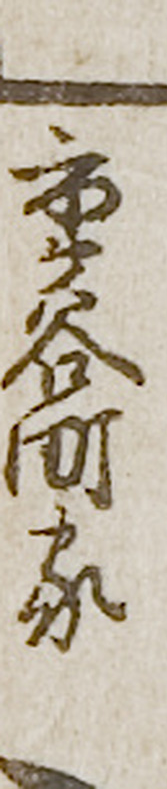市ヶ谷町家
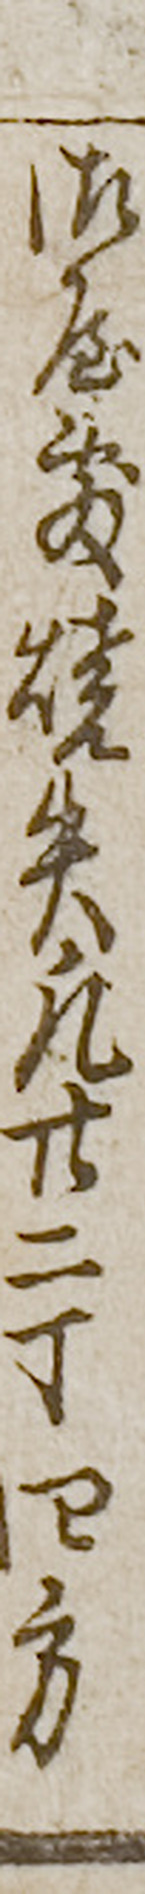御屋敷焼失凡廿二丁四方
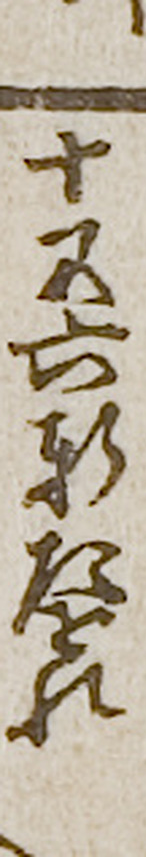十五六軒たをれ
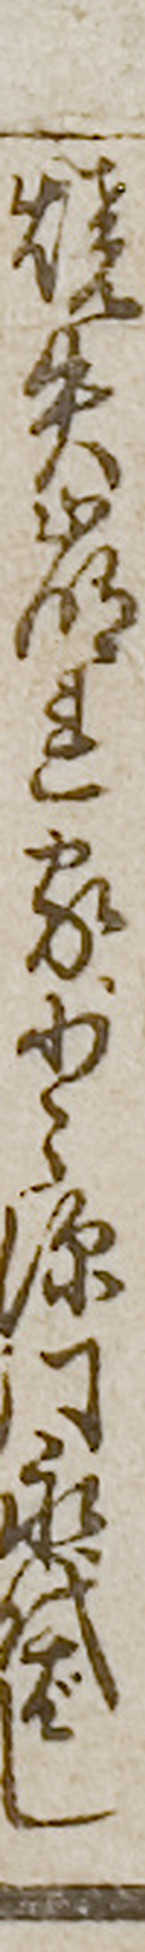焼失崩れ家少々深川永代ばし
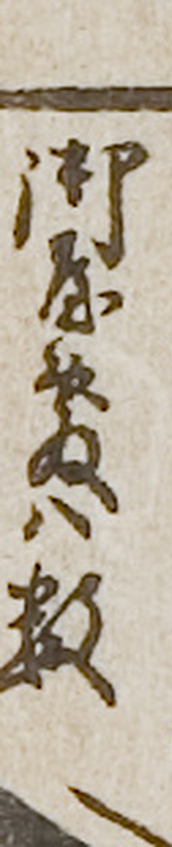御屋敷は数
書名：東都珍事実録咄
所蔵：東京大学総合図書館 General Library in the University of Tokyo, JAPAN
